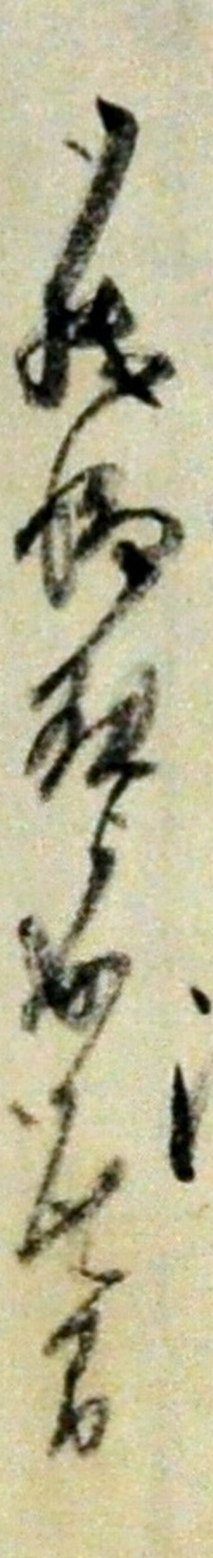御機嫌能被成御座間
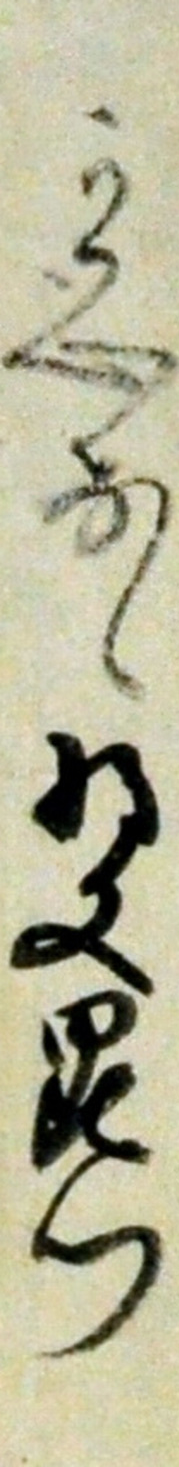可御心安候将又毘門
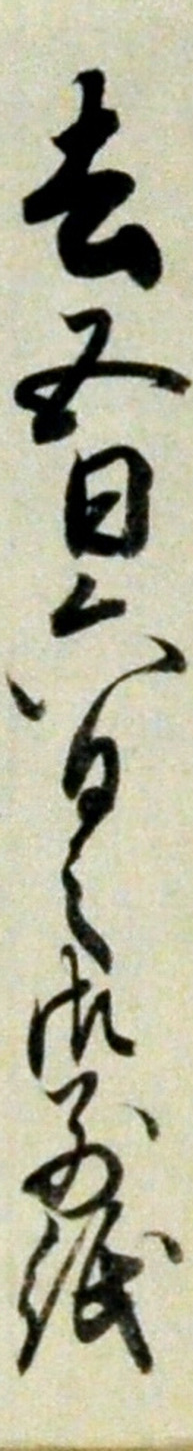一去五日六日之御別紙
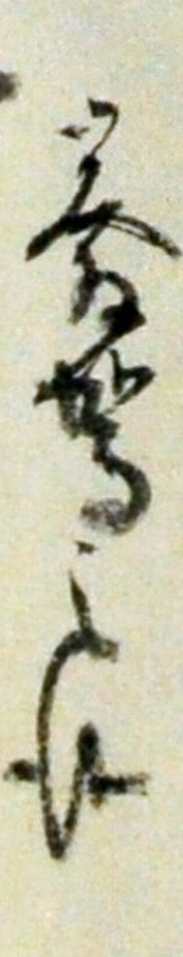御発駕之儀
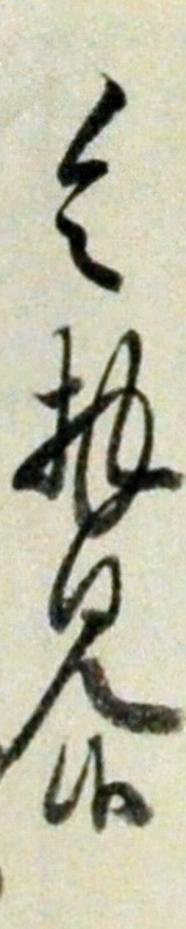令拝見候
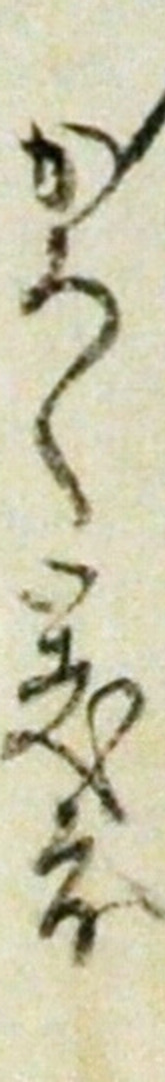かろく御支度
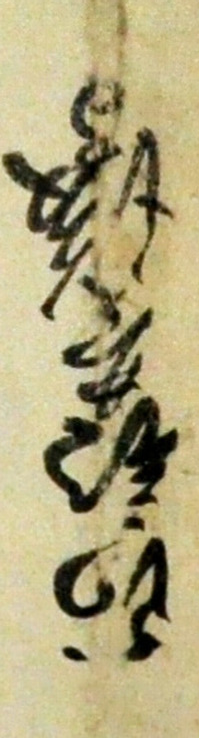相進候以上
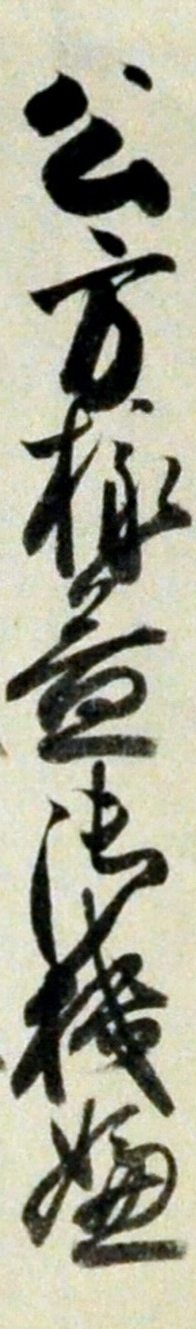公方様益御機嫌
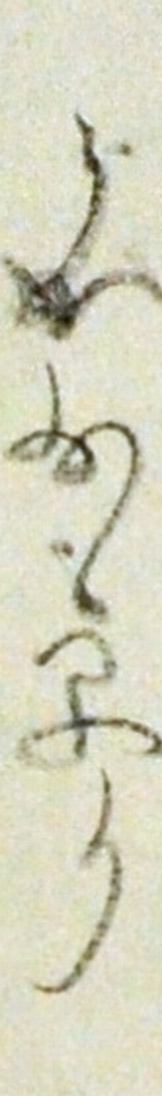被成少も早ク
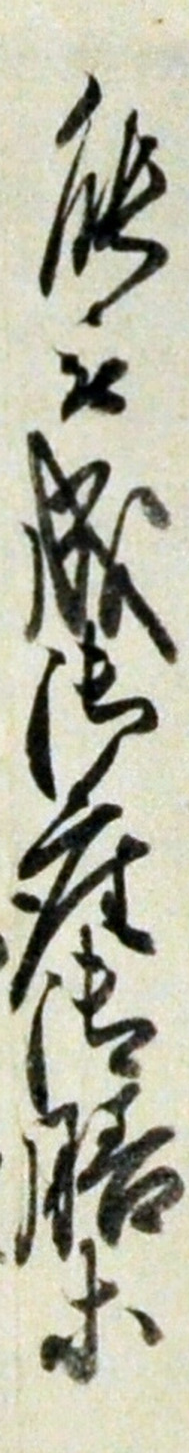能被成御座御膳等
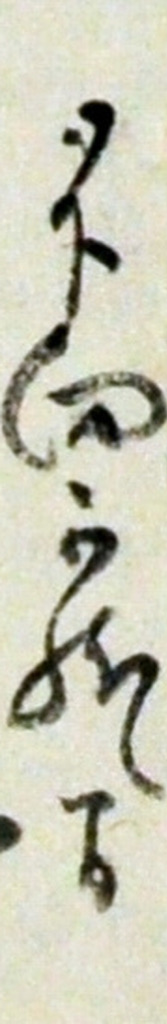御下向可給候間
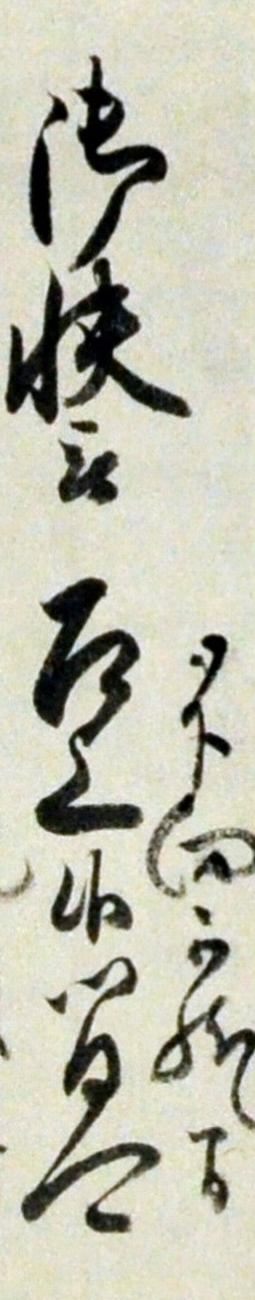御快被召上候間可
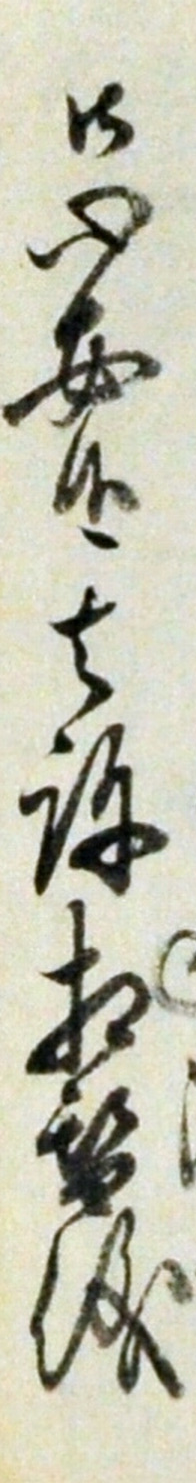御心安候其許相替儀
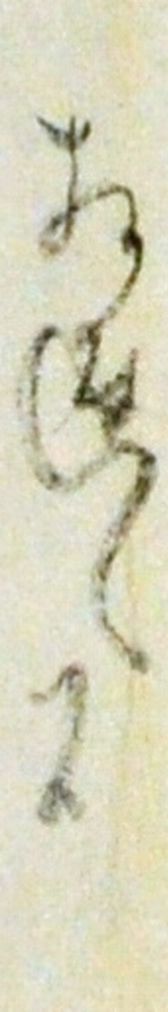相進候以上
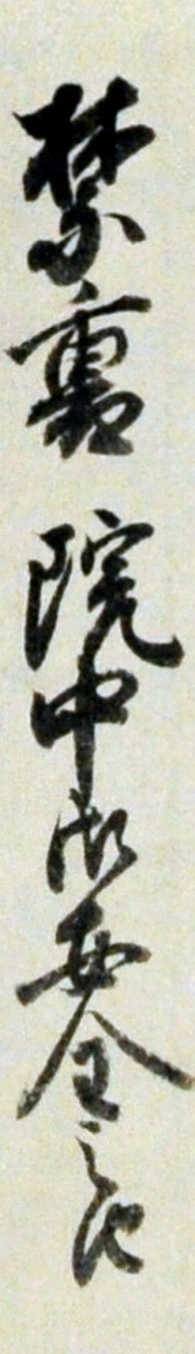禁裏院中御安全之由
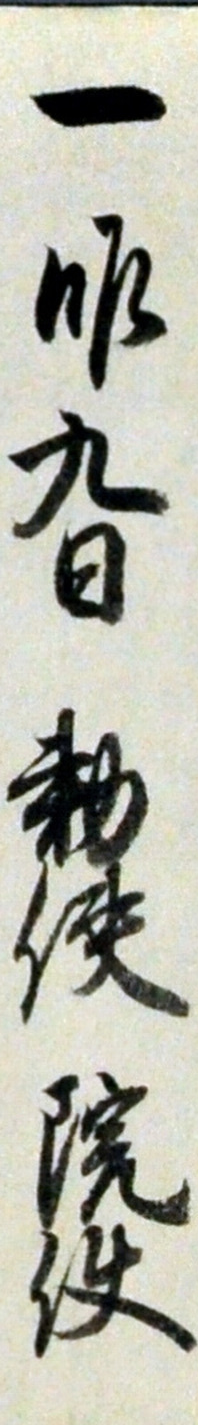一昨九日勅使院使
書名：書状
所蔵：伊那市立高遠町図書館・合同会社AMANE
